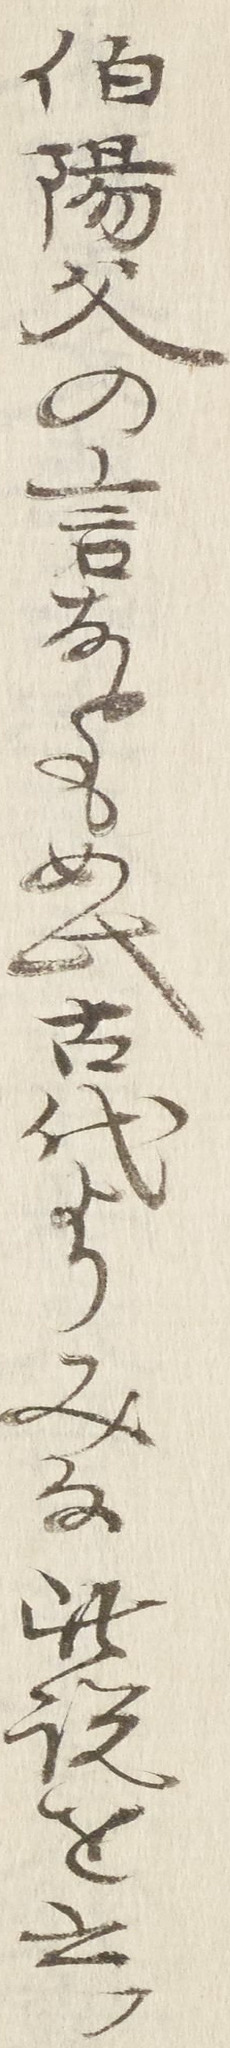伯陽父の言なとも如此古代よりみな此説を云ふ
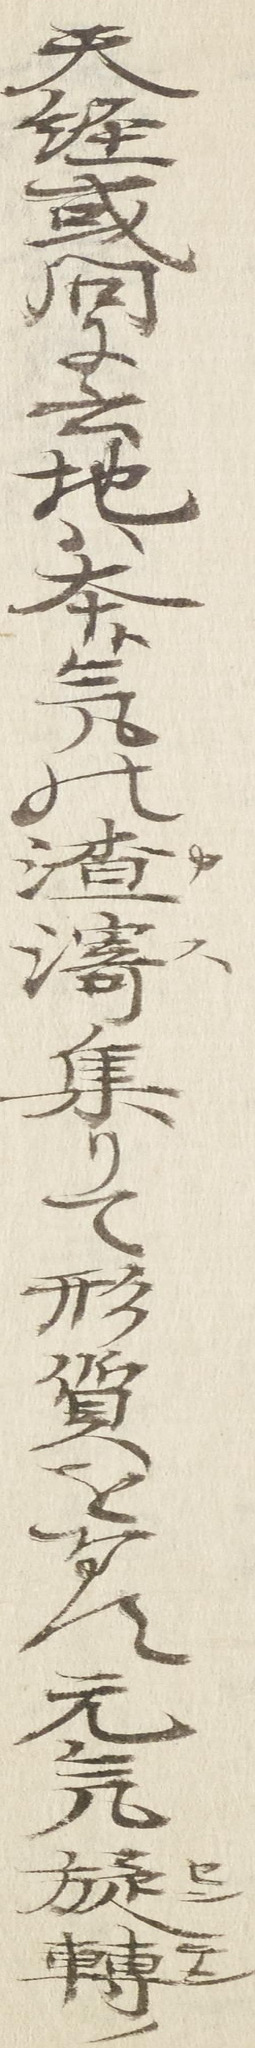天徑或問に云地は本と気の渣滓集りて形質をなす元気旋転の
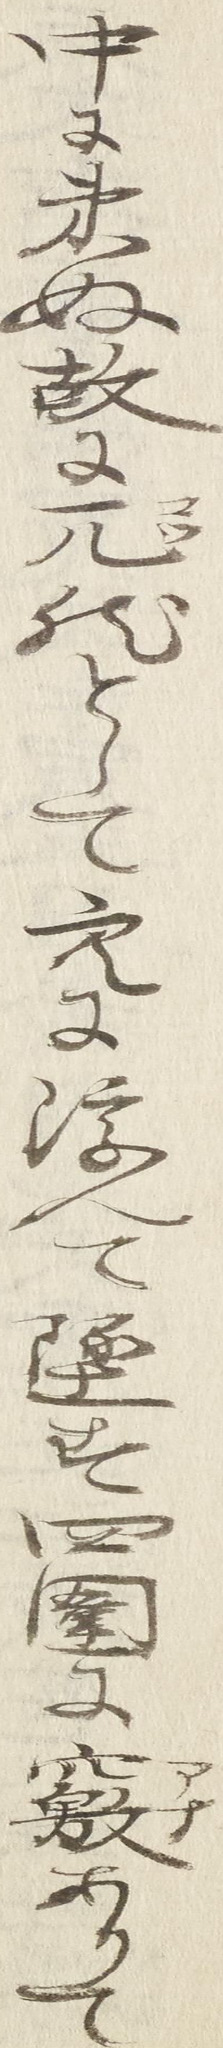中に束ぬ故に兀然として空に浮んて墜す四圍に竅ありて
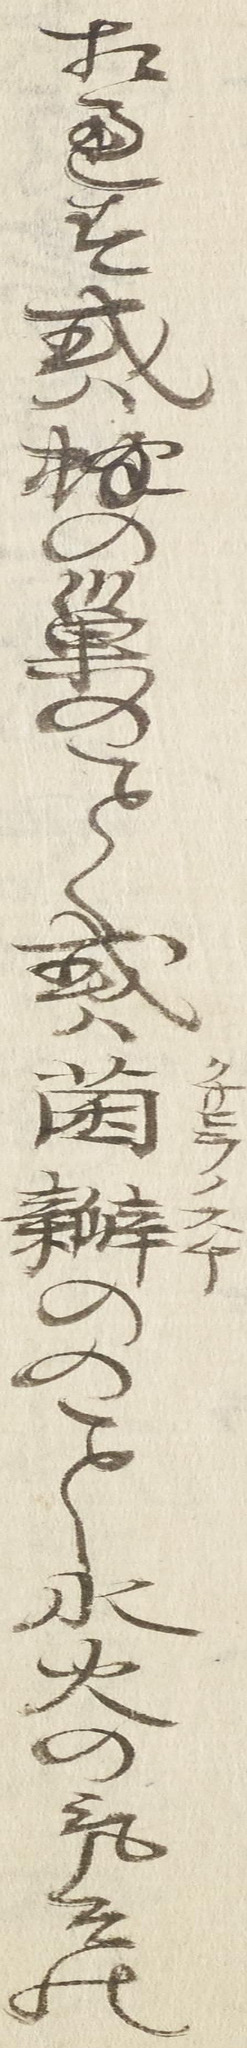相通す或は蜂の巣のことく或は菌辨ののことく水火の気その
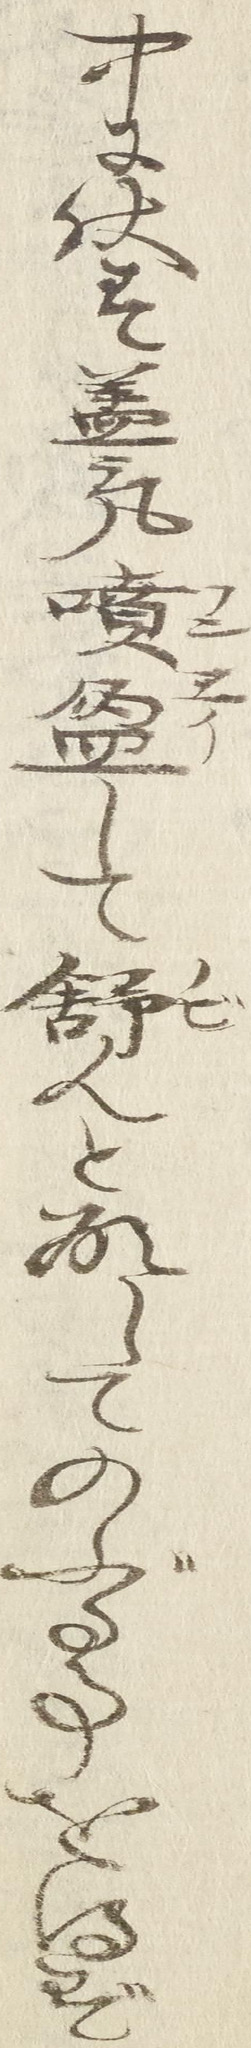中に伏す蓋気噴盈して舒んとなしてのぶる事を得ず
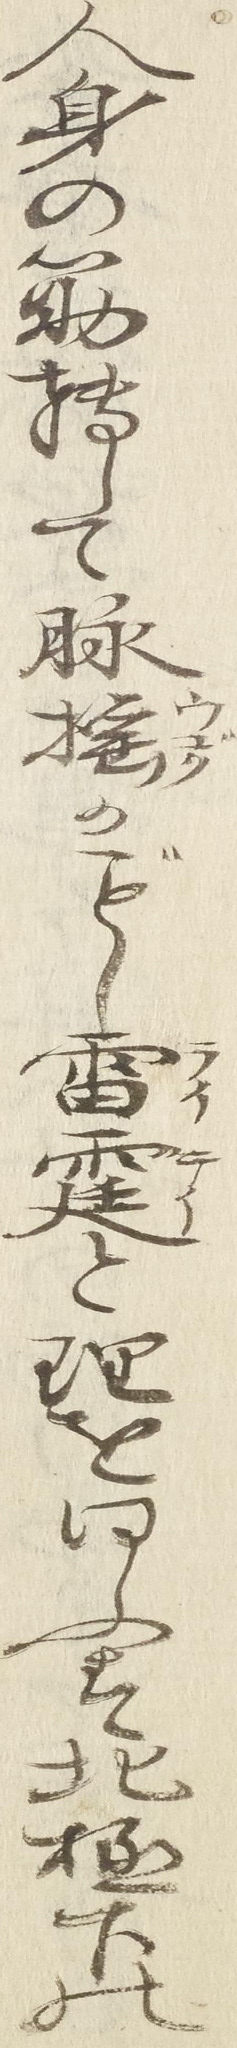人身の筋転して脉揺かごとく雷霆と理を同ふす北極下の
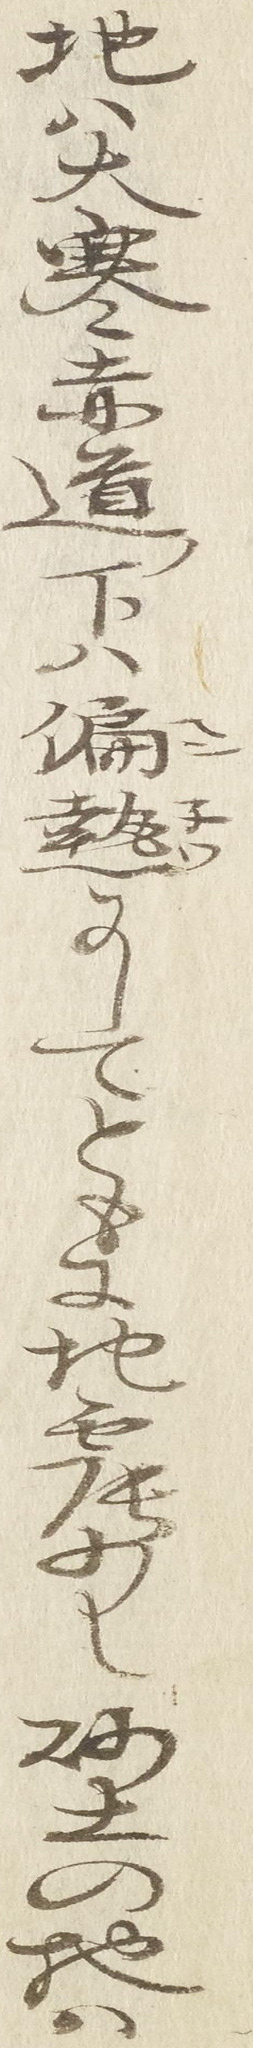地は大寒赤道の下は偏熱にしてともに地震少し砂土の地は
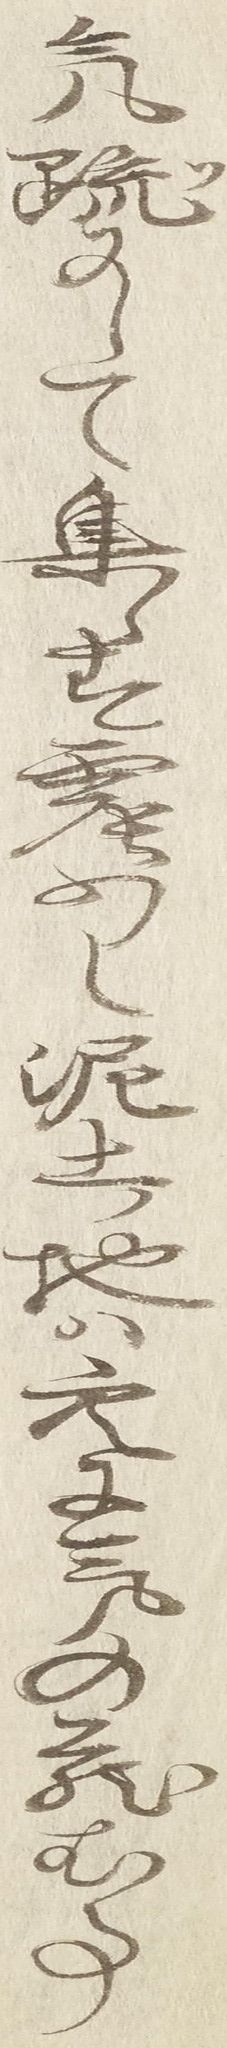気疏にして集らす震少し泥土の地は空に気の蔵むる
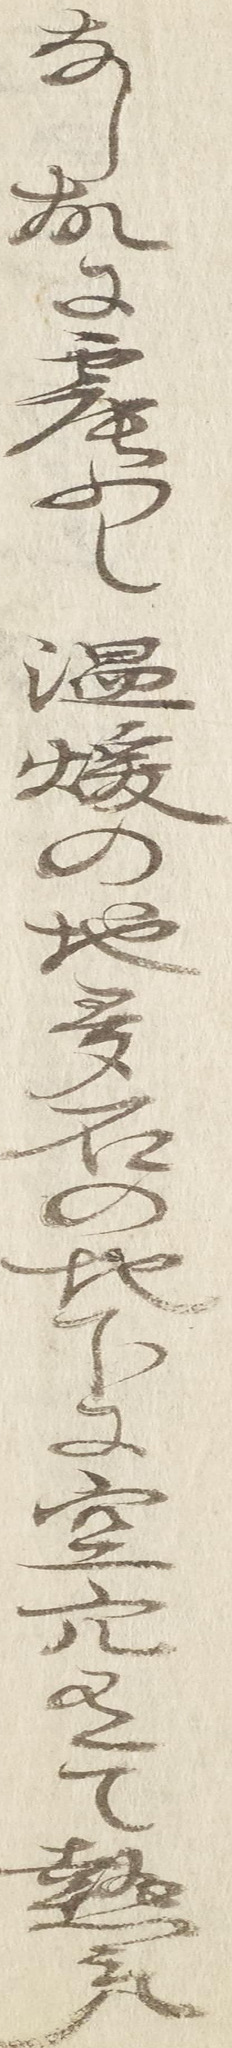なし故に震少し温暖の地多石の地下に空穴有て熱気
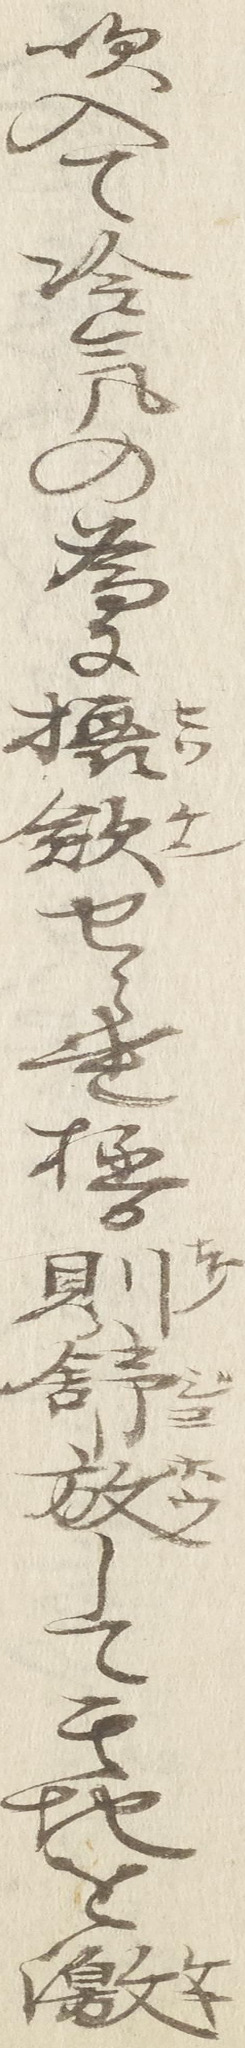吹入て冷気の為に櫃歛せられ極る則舒放して其地を激
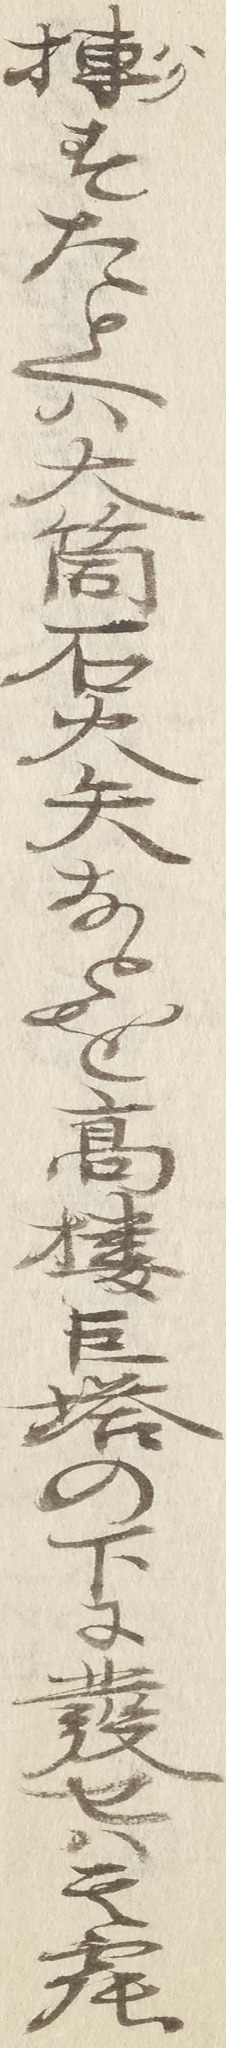縛すたとへは大筒石火矢なとを高楼巨塔の下に発せは其震
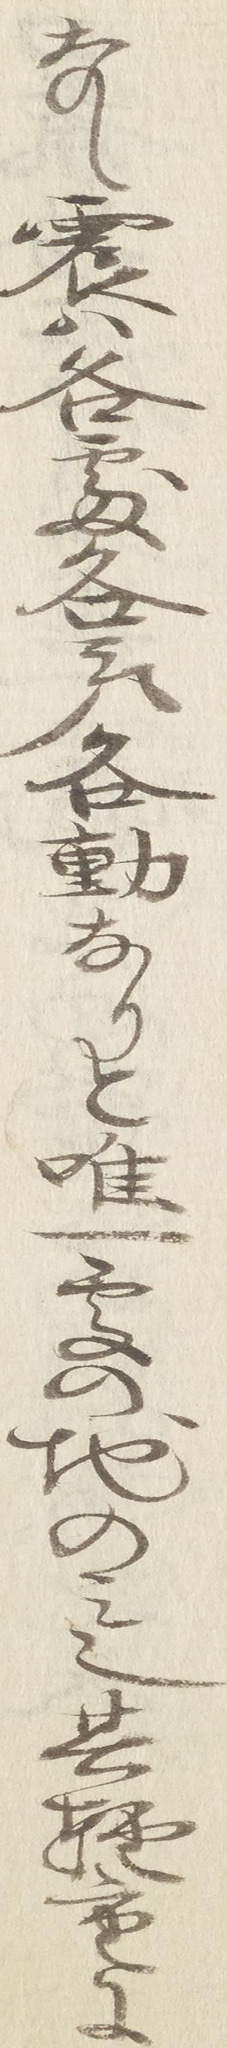なし震は各震各気各動なりと唯一処の地のみ也其軽重に
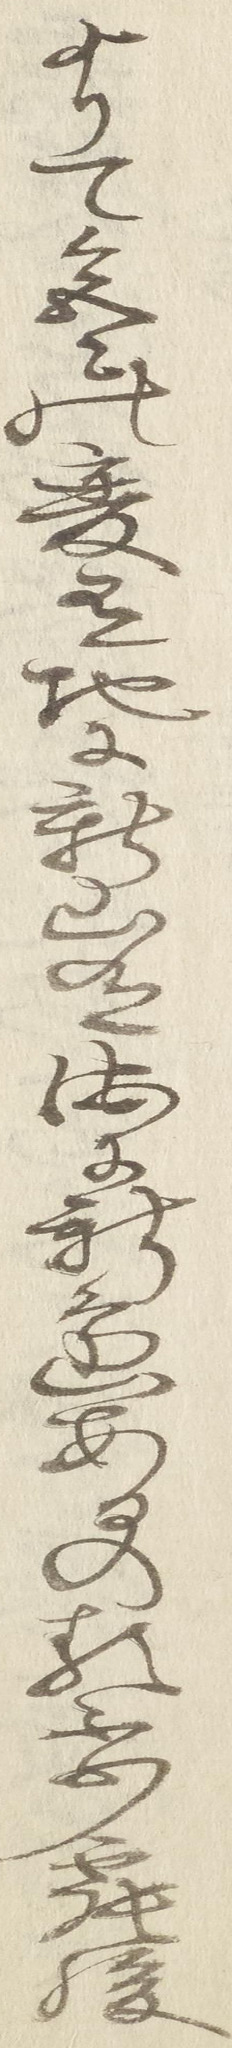よりて色々の変有地に新山有海に新島あるの類不少震後
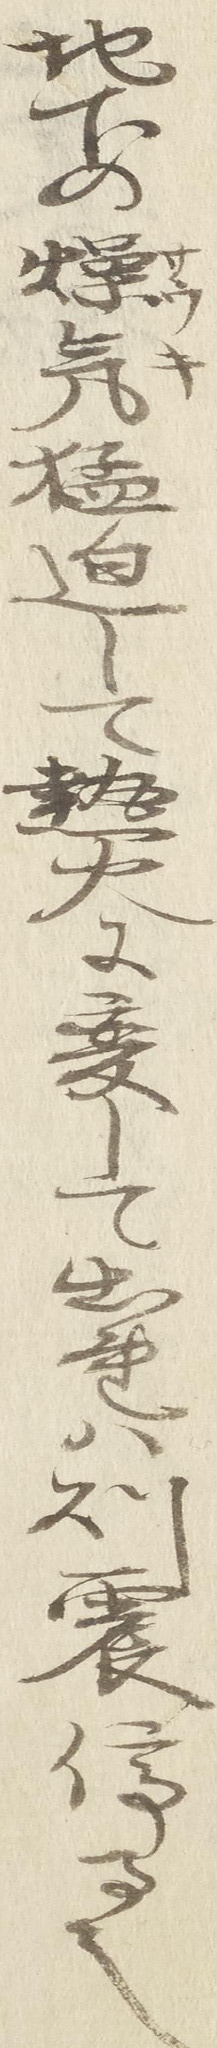地下の燥気猛迫して熱火に変して出れは則震停る也

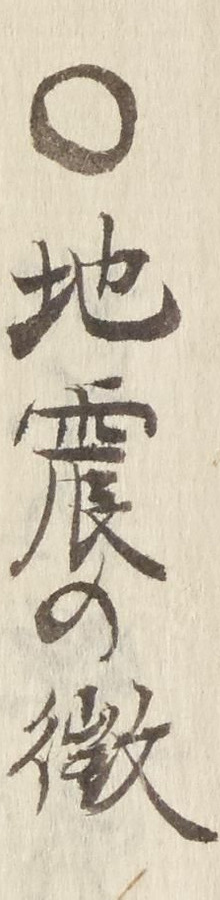○地震の徴
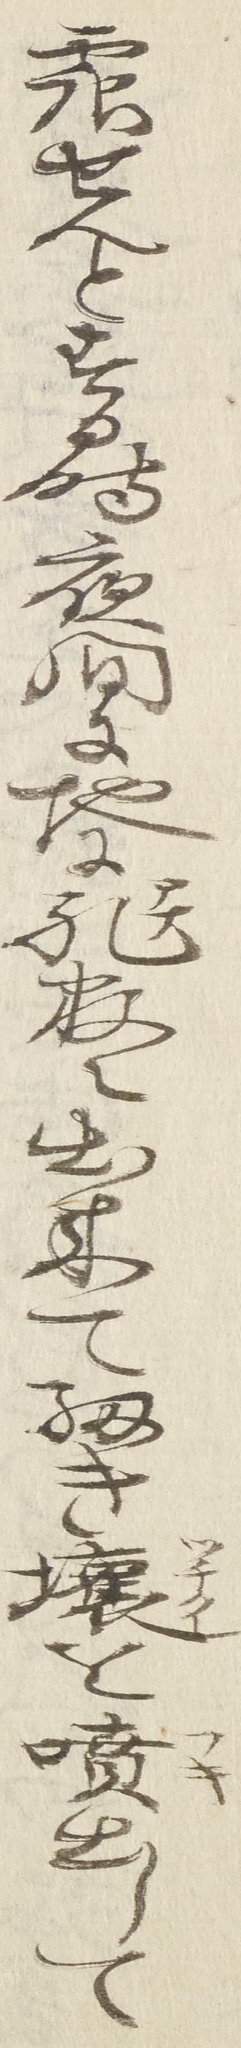震せんとする時夜間に地に孔数々出来て細き壌を噴出して
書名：地震記　下
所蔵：東京大学地震研究所図書室 Earthquake Research Institute Library, The University of Tokyo, JAPAN
